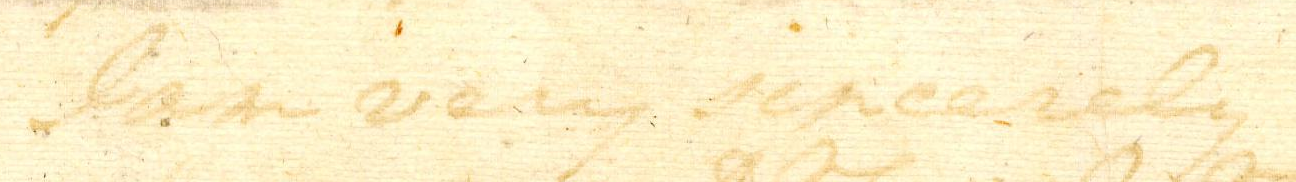I am very sincerely
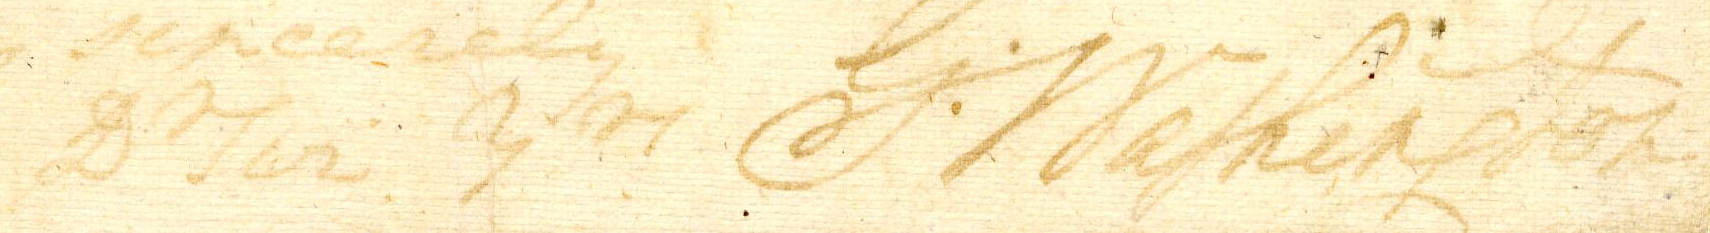D^r Sir Y^rs G^o: Washington
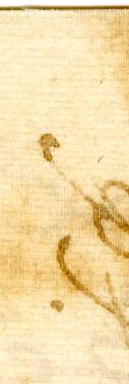PS.
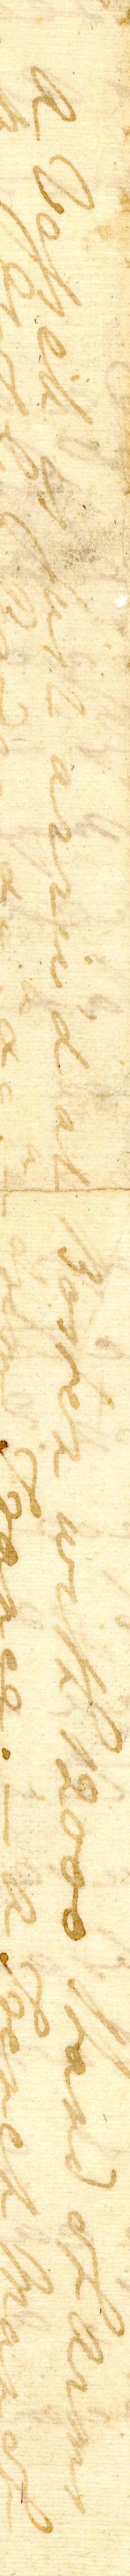a Vessell is just arriv'd at Boston with 12000 stand of arms
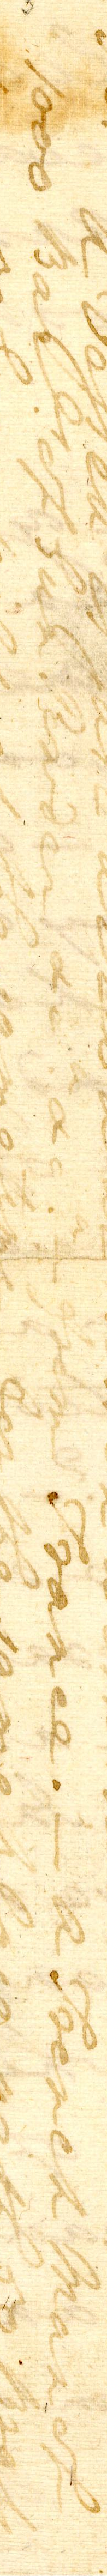1000 Bar^l. of Gun Power &c^a. &c^a. from France.- A French Man of
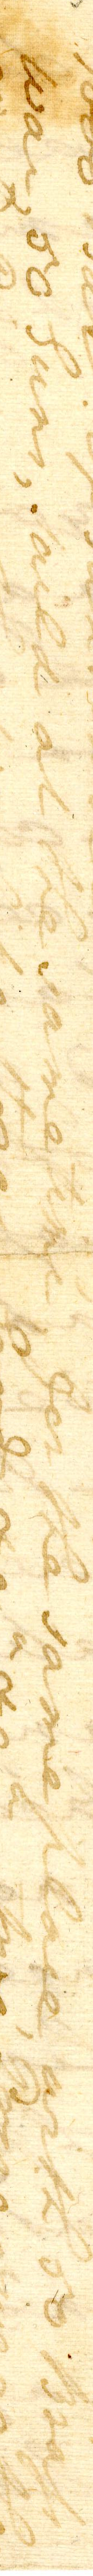war, 50 Guns, sail'd at the same time for the same place, with 50 Brass
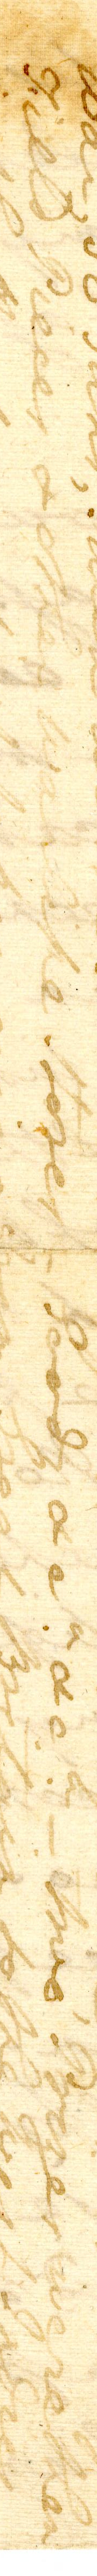Field Pieces & other warlike stores- Goods &c^a. &c^a.- two Prizes were then
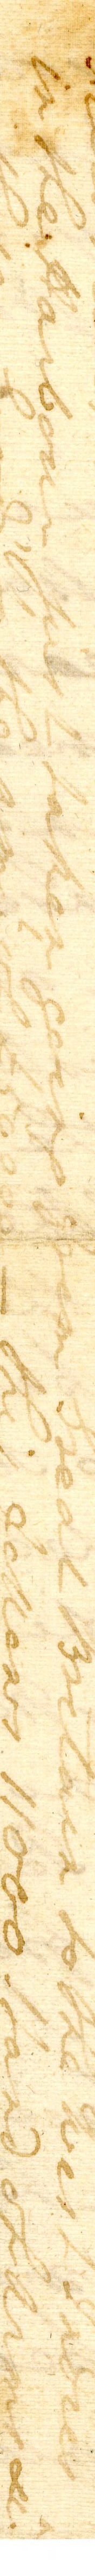in the Harbour, just taken, going from Great Britain to the West Indies
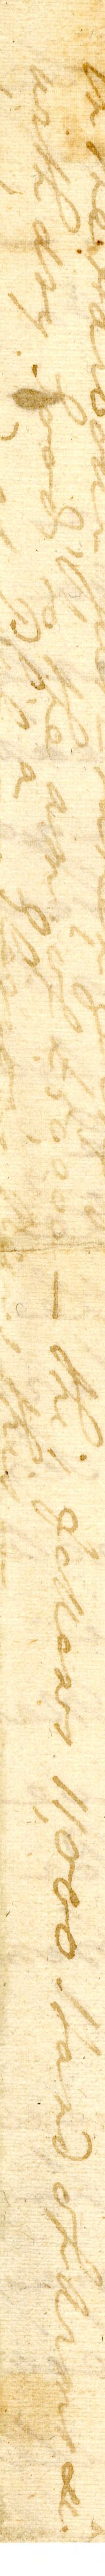with dry goods to the am^t. of £50,000- this follows 11,000 stand of arms &c.
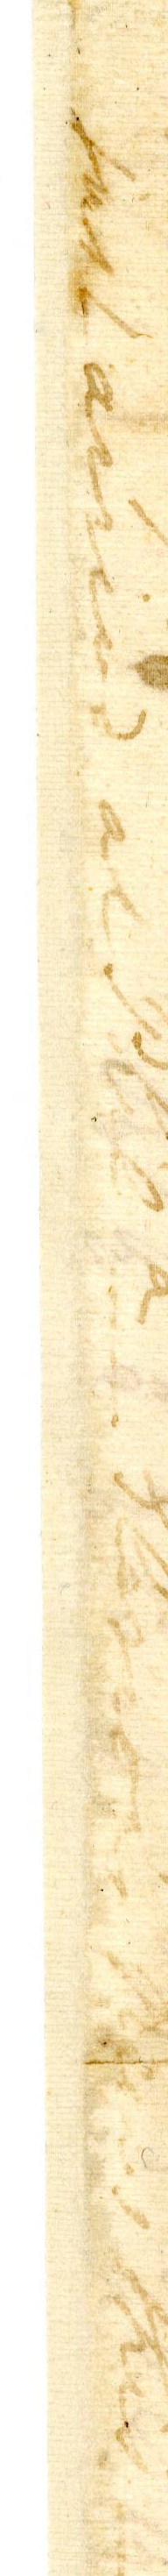just arrived at Phil^a. Glorious news this.
